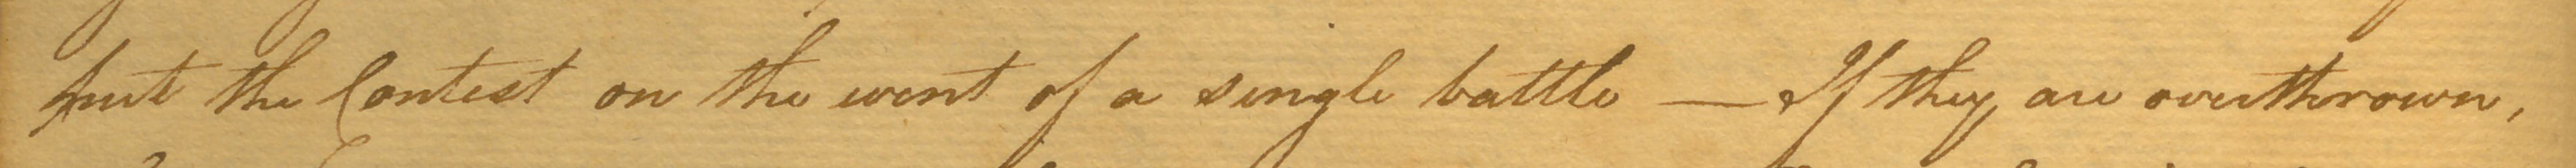put the Contest on the want of a single battle- If they are overthrown,
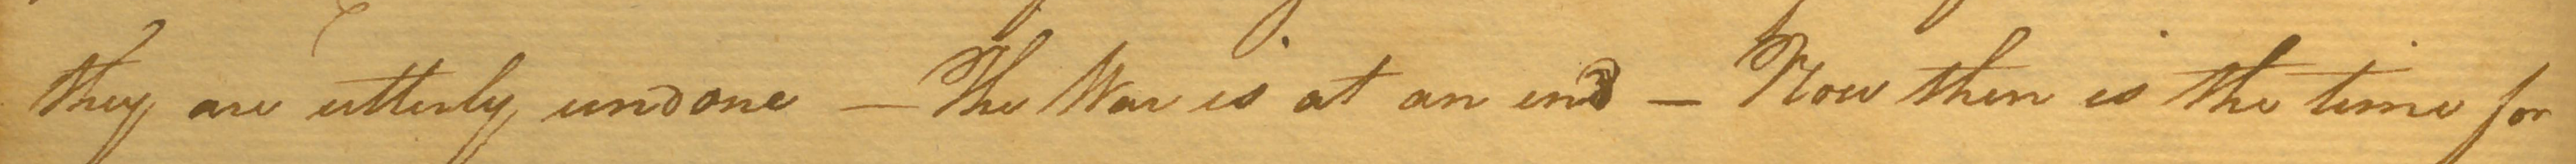they are utterly undone- The War is at an end- Now then is the time for
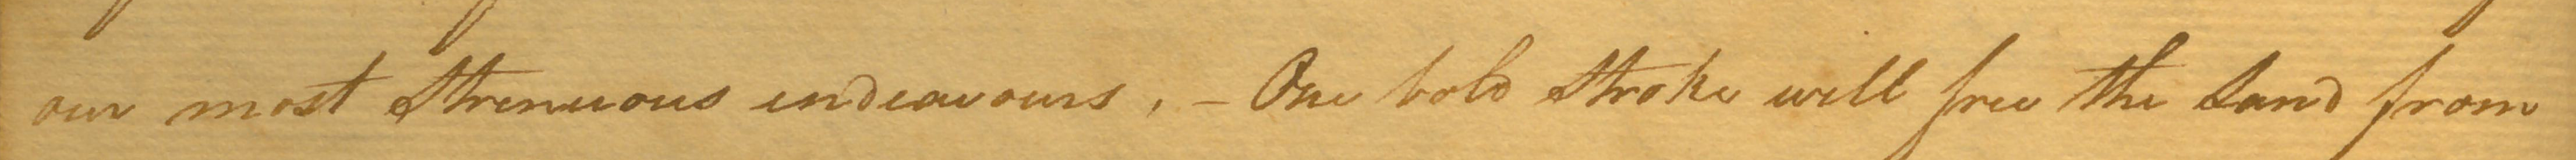our most Strenuous endeavours,- One bold Stroke will free the Land from
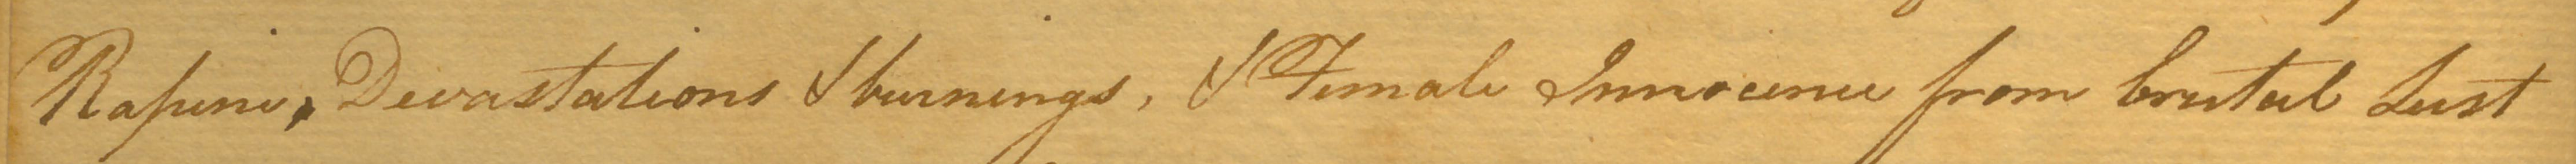Rapine, Devastation & burnings, & Female Innocence from brutal Lust
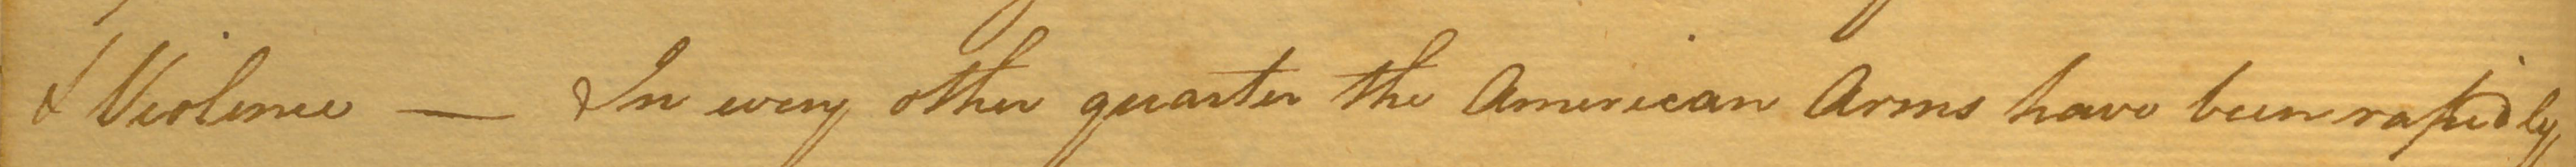& Violence- In every other quarter the American Arms have been rapidly
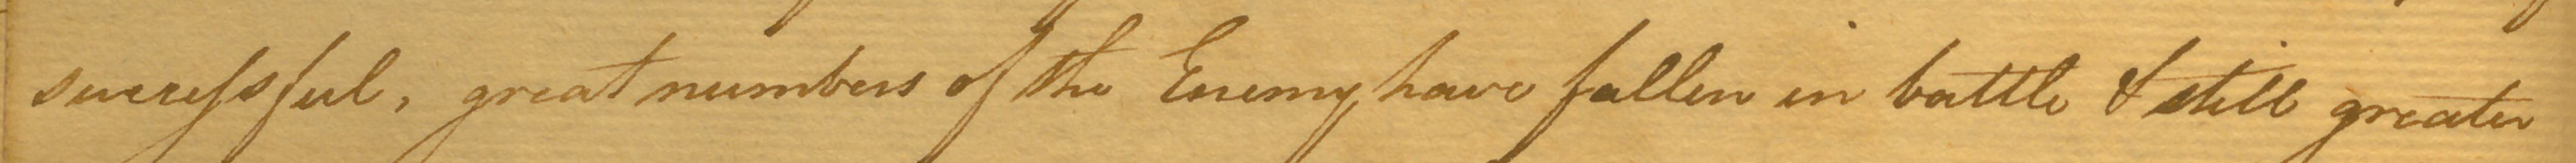successful, great numbers of the Enemy have fallen in battle & still greater
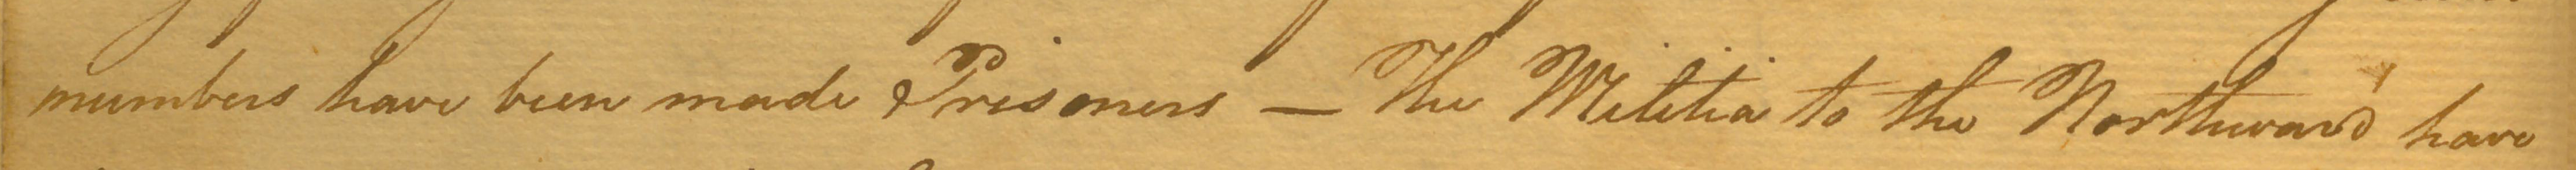numbers have been made Prisoners- The Militia to the Northward have
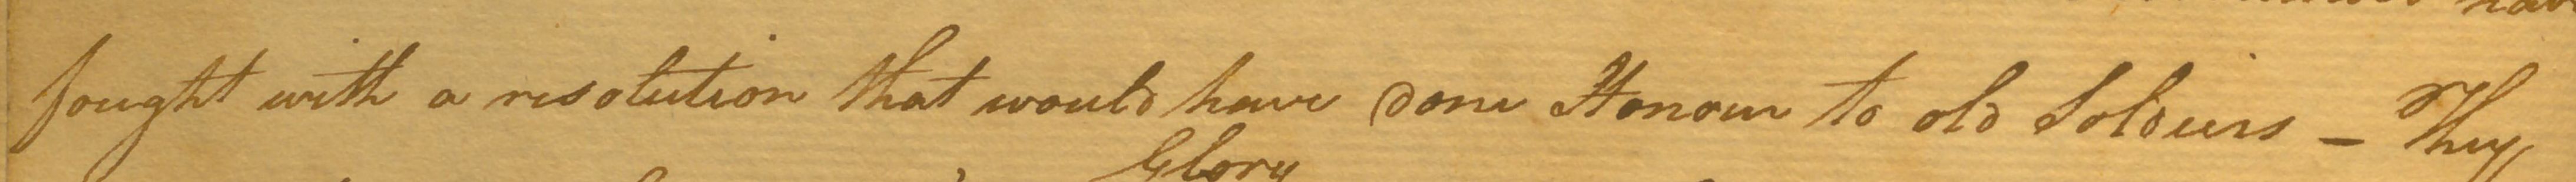fought with a resolution that would have some Honour to old Soldiers- They
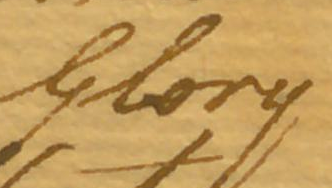Glory
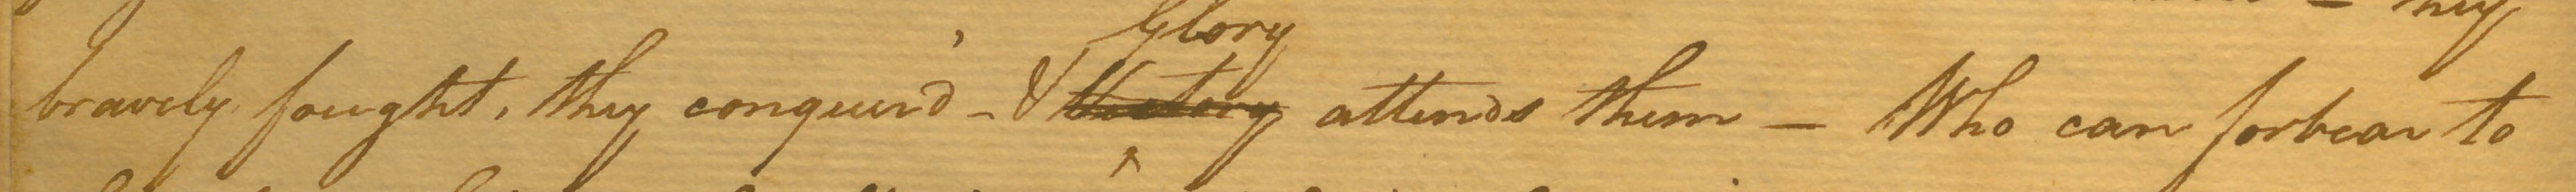bravely fought, they conquer'd- & [_______] attends them- Who can forbear to
